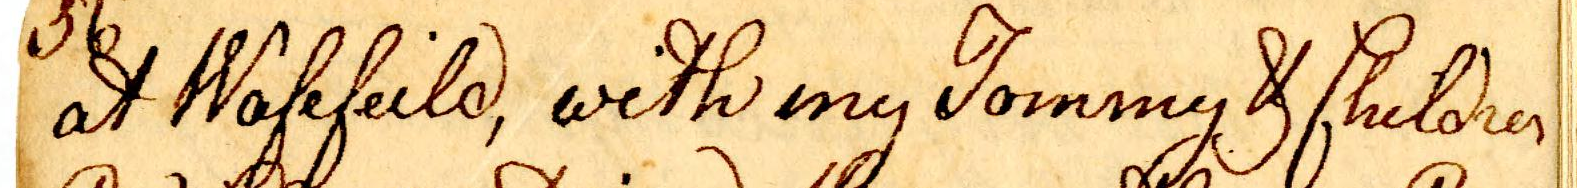at Wafefeild, with my Tommy & Children
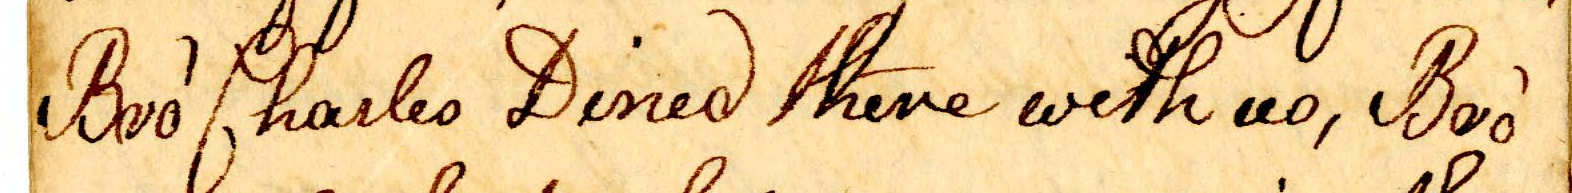Bro' Charles Dined there with us, Bro'
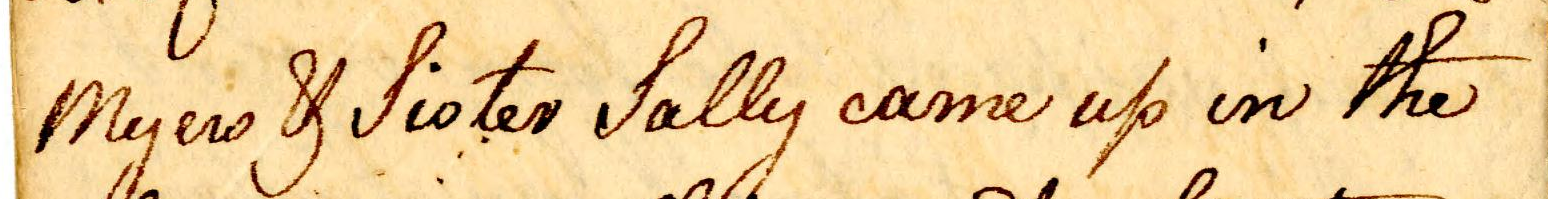Myers & Sister Sally came up in the
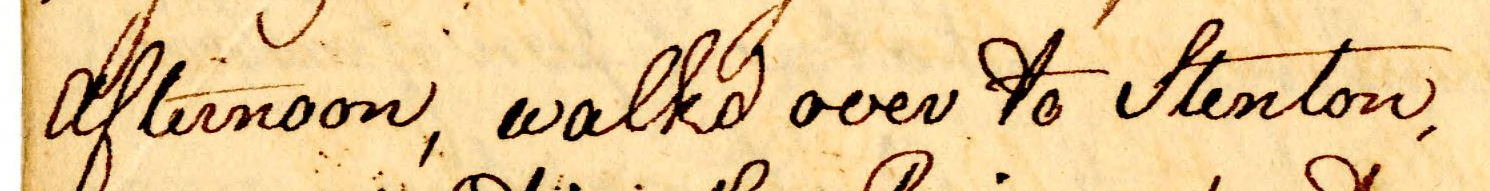Afternoon, walkd over to Stenton,
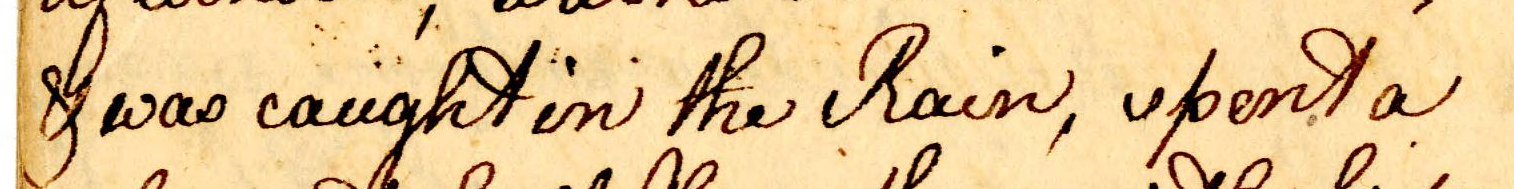& was caught in the Rain, spent a
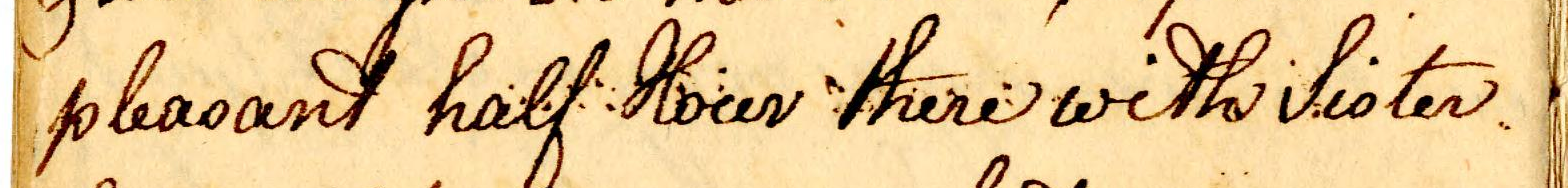pleasant half Hour there with Sister
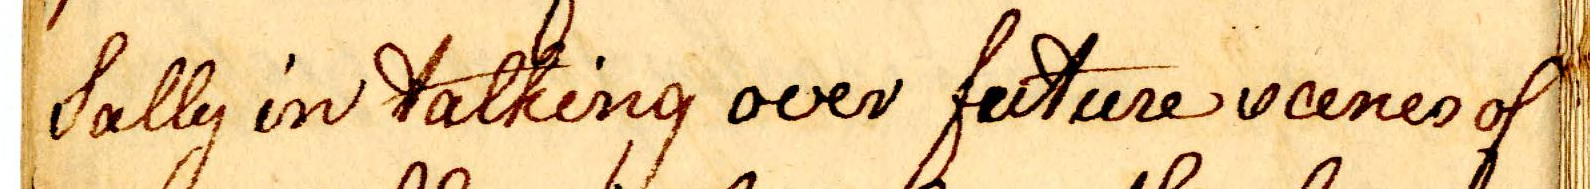Sally in talking over future scenes of
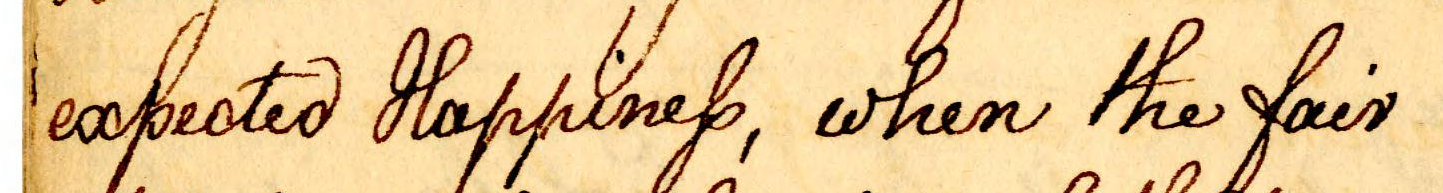expected Happiness, when the fair
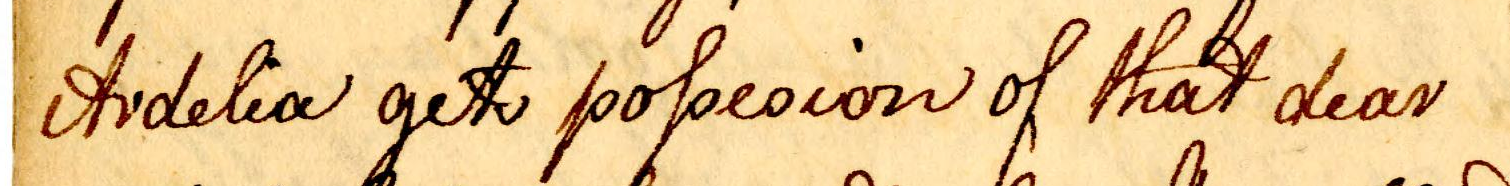Ardelia gets possesion of that dear
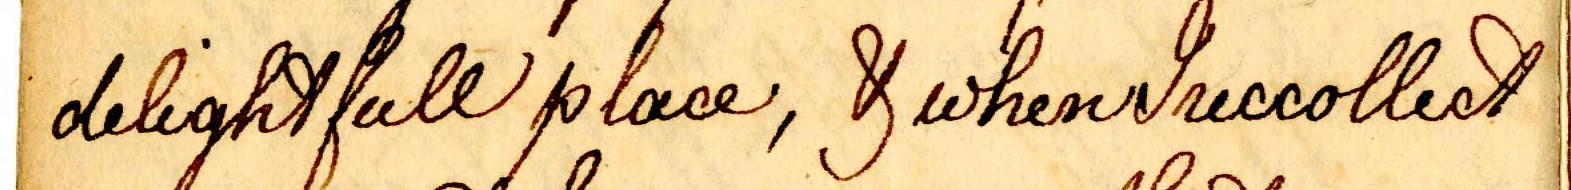delightfull place, & when I reccollect
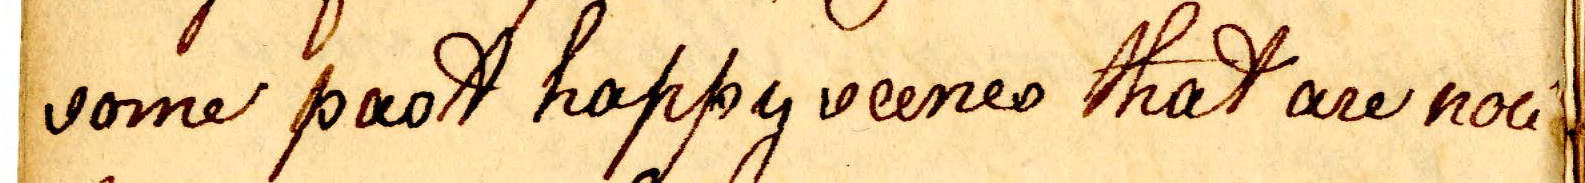some past happy scenes that are now
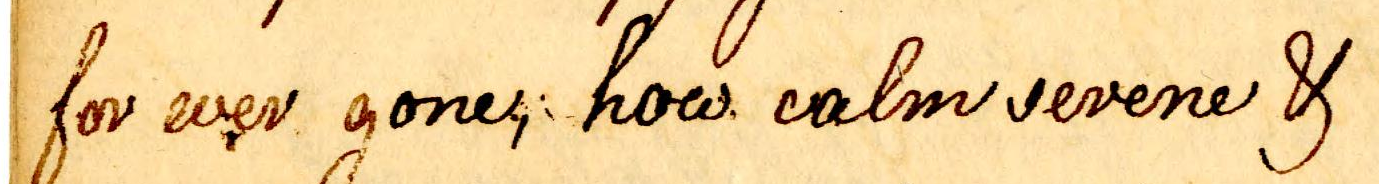for ever gone, how calm serene &
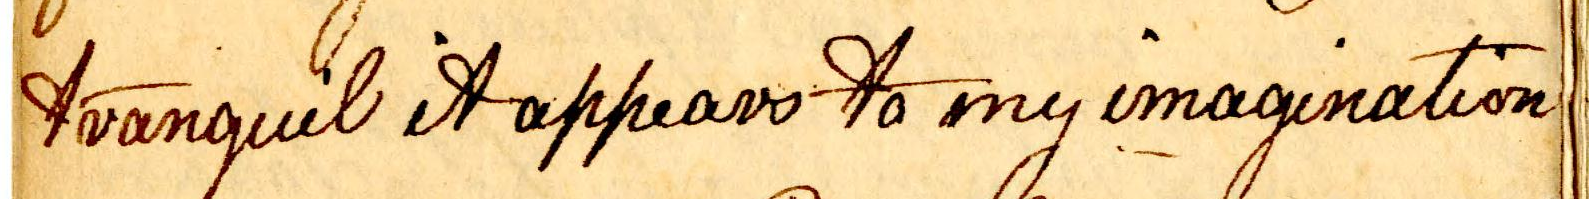tranquil it appears to my imagination
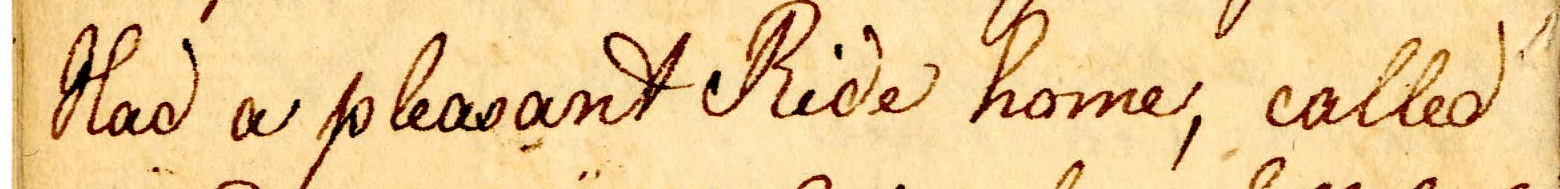Had a pleasant Ride home, called
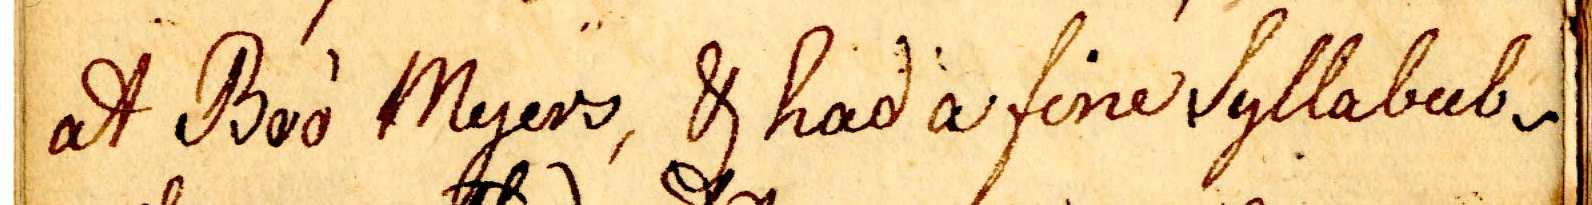at Bro' Myers, & had a fine Syllabubs
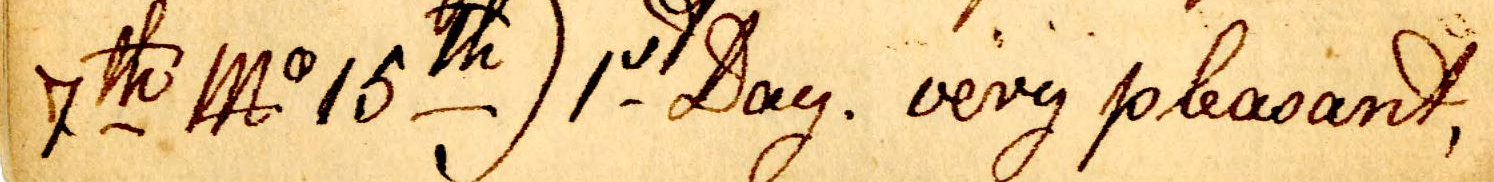7^th M^o 15^th) 1^st Day, very pleasant
